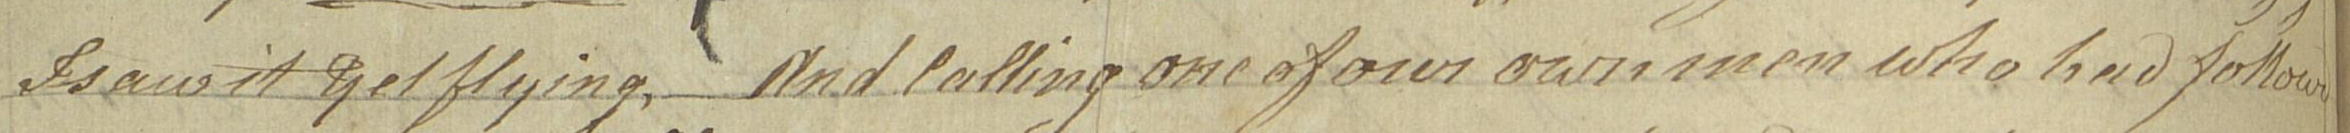I saw it Get flying, And Calling one of our own men who had follow-
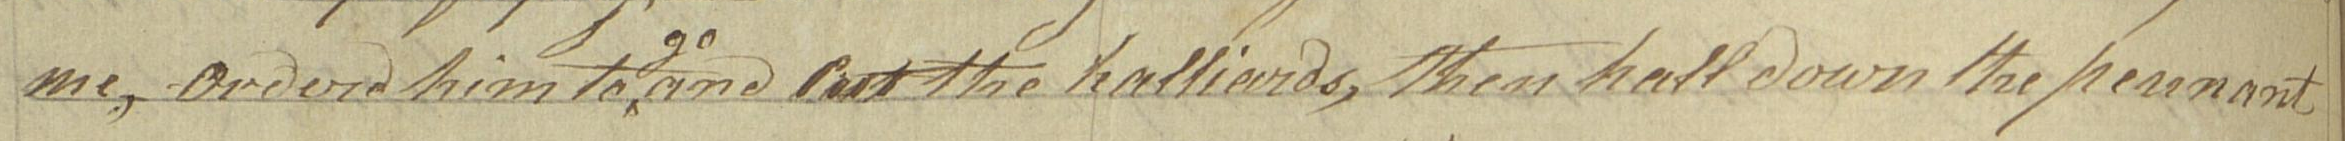me, Orderd him to ^ and cut the halliards, then hall down the pennant
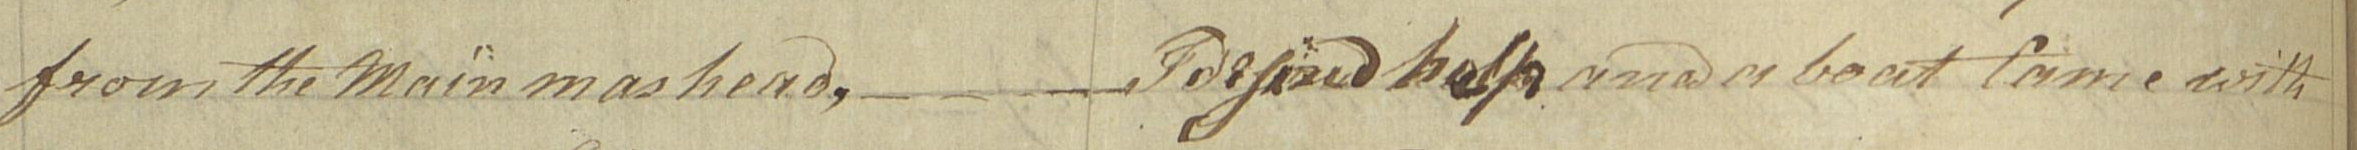fro the Main mashead, I desird help and a boat Came with
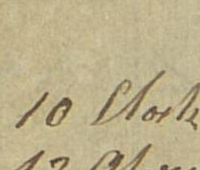10 Clock
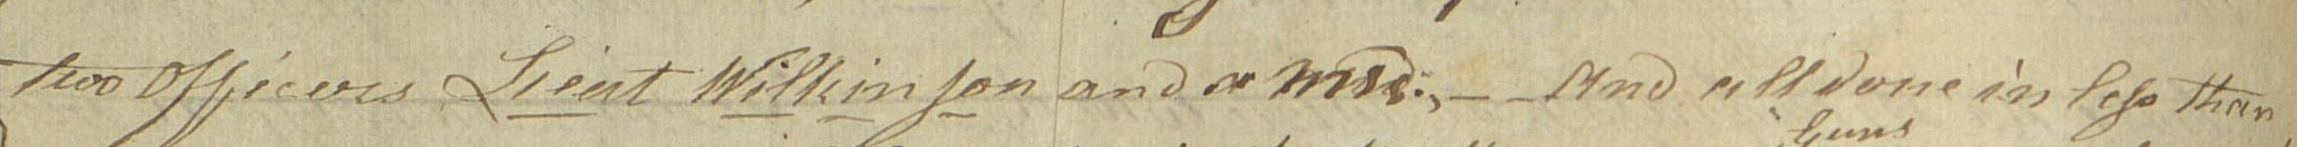two Officers Lieut Wilkinson and a Miss; And all done in less than
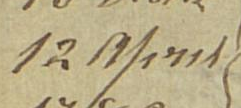12 April
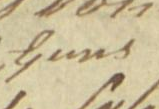Guns
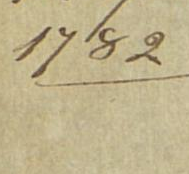1782
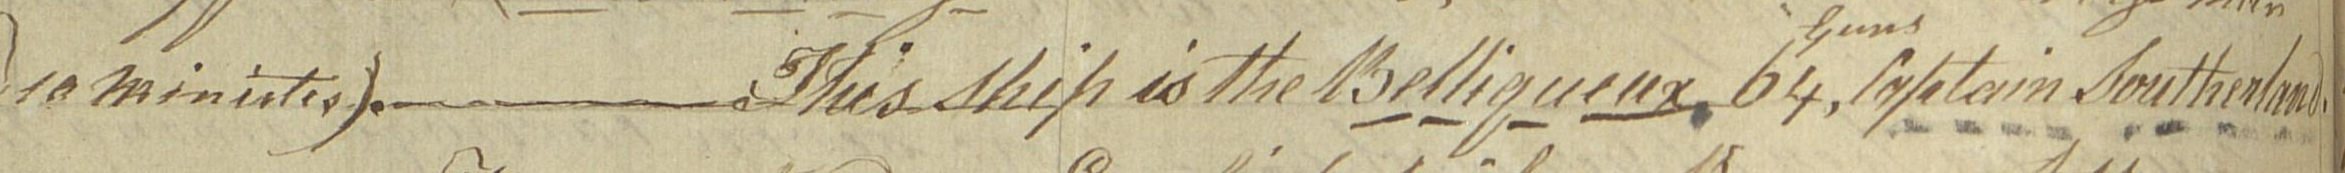10 minutes). This ship is the Belliqueux 64, Captain Southerland
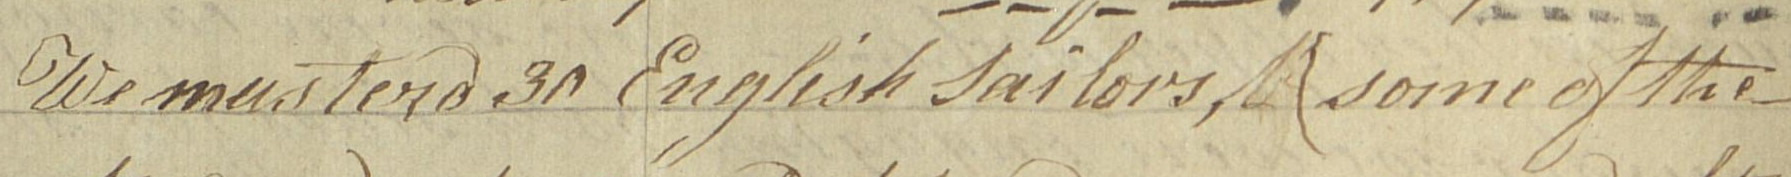We musterd 30 English Sailors, (some of the
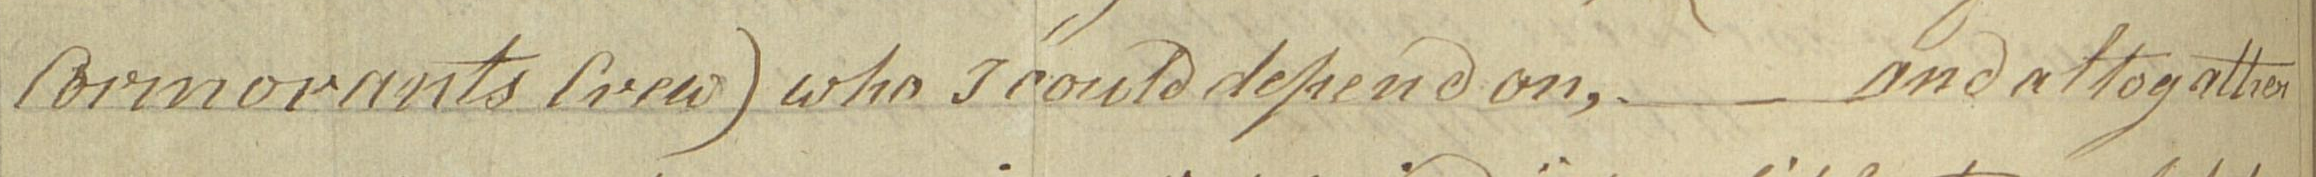Cormorants Crew) who I could depend on, and altogather
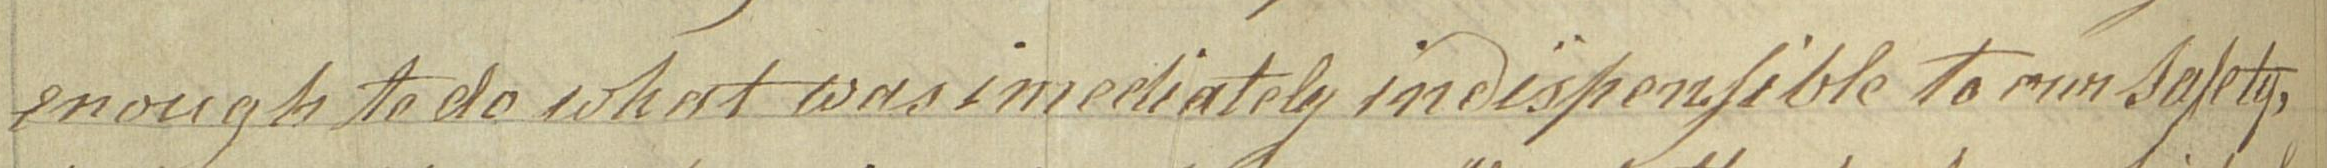enough to do what was imediately indispensible to our Safety,
